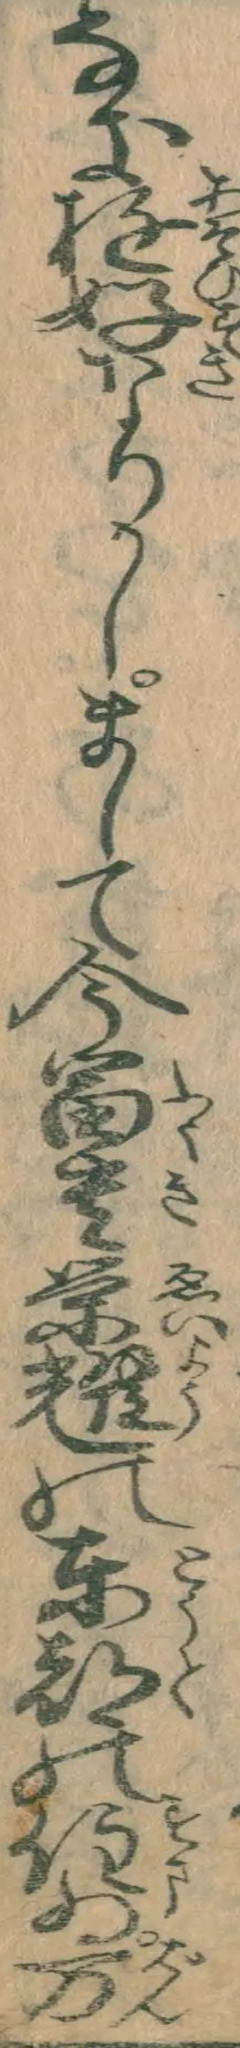なき遊好なりかし。まして今富貴栄耀の東都の住ゐ。万

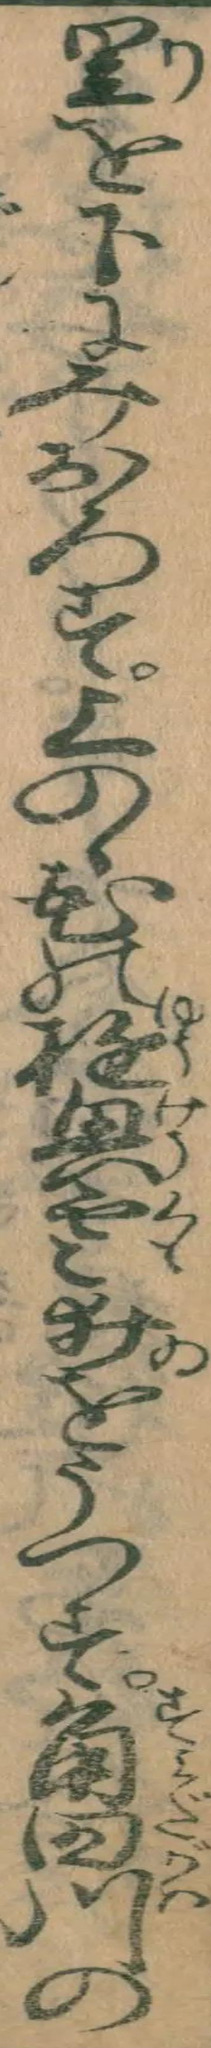里を下にみおろす。上のゝ花の遊興雲井をうつす。角田川の
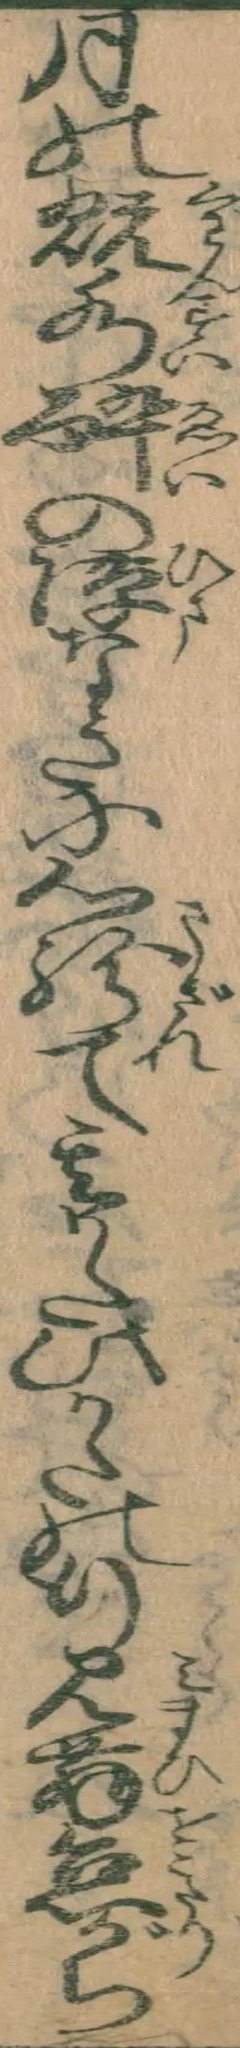月の翫水酔の隙なきに心紛て其かた此かたの行見舞怠がち
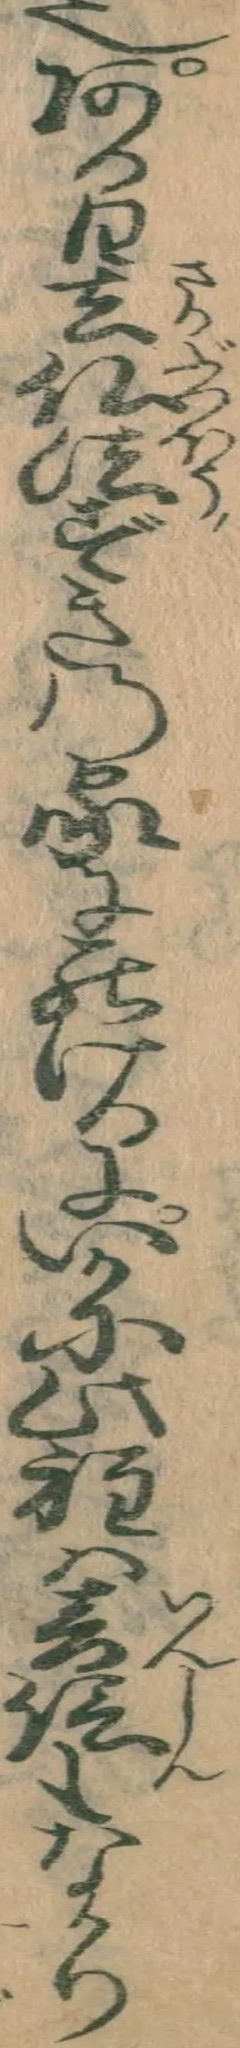也。ある日去仏法ずきの家に罷けるに。いかに此程は音信もなかり
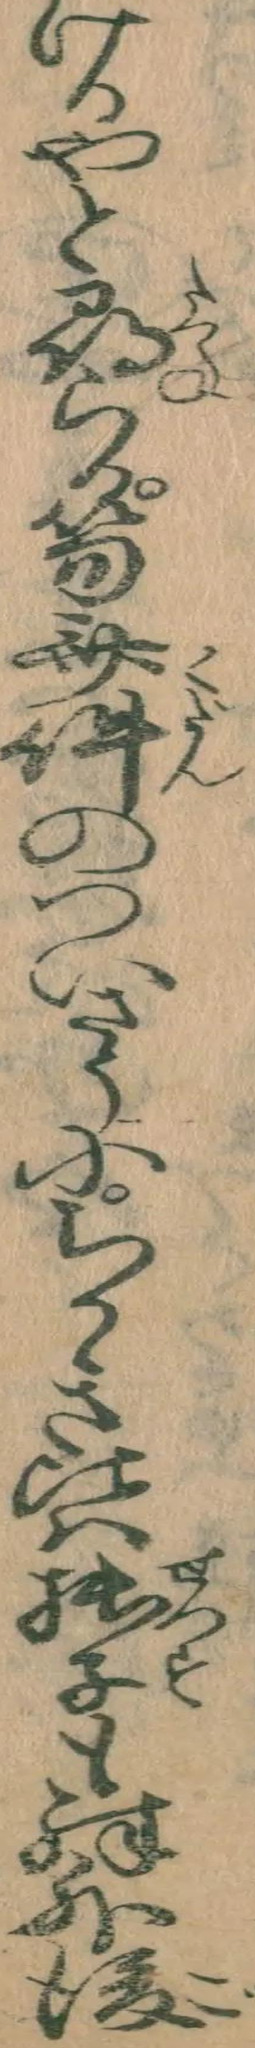けるやと尋らる。筍斎件のついさうに。ちかき比は拙子も殊外後
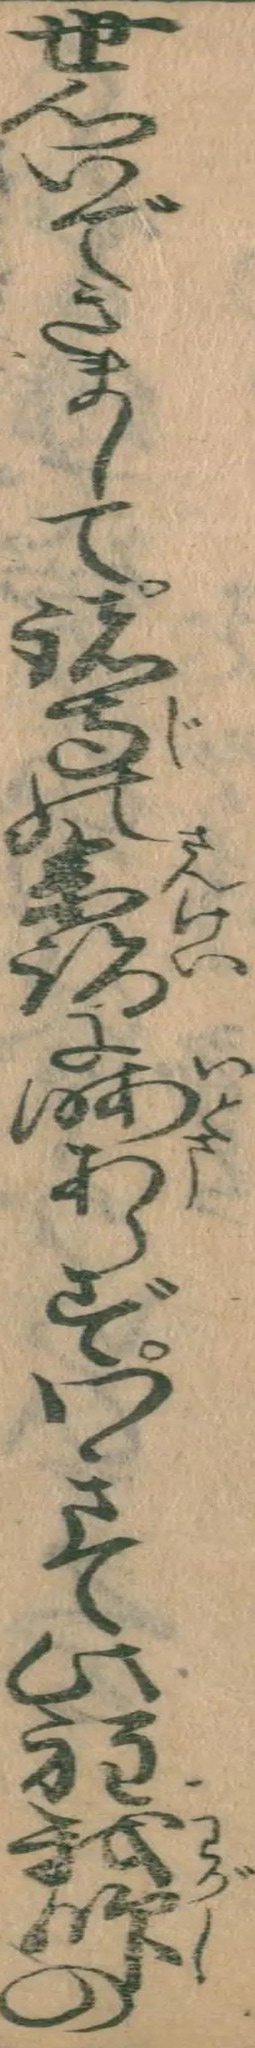世心いできまして。諸寺の参詣に暇あらず。わきて此程我師の
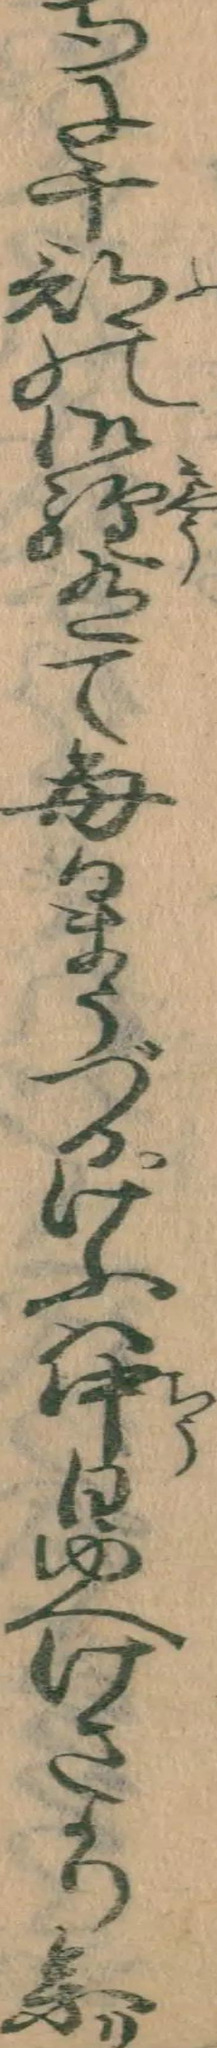寺に千部の御経有て毎日まうづる。けふは中日ゆへけさより参り
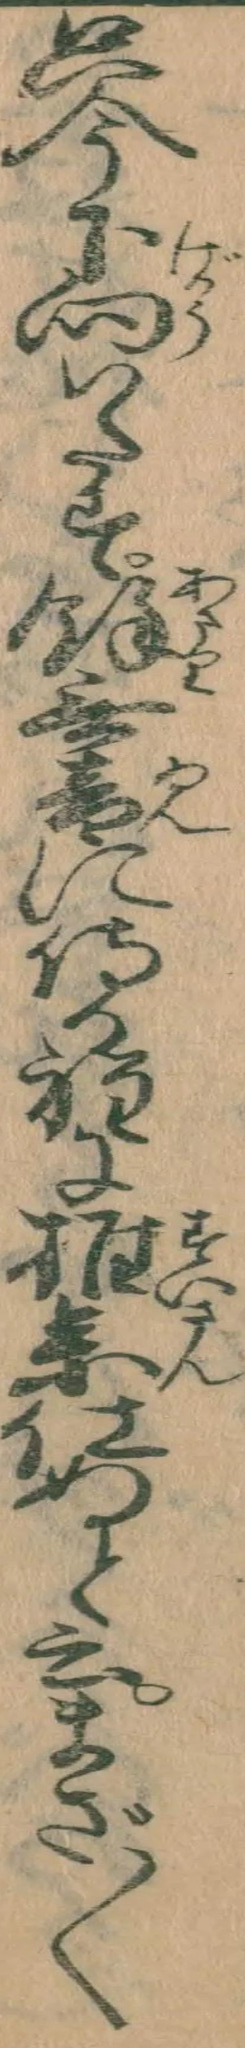只今下向いたす。余無音に侍る程に推参仕ぬと云。まざ〳〵
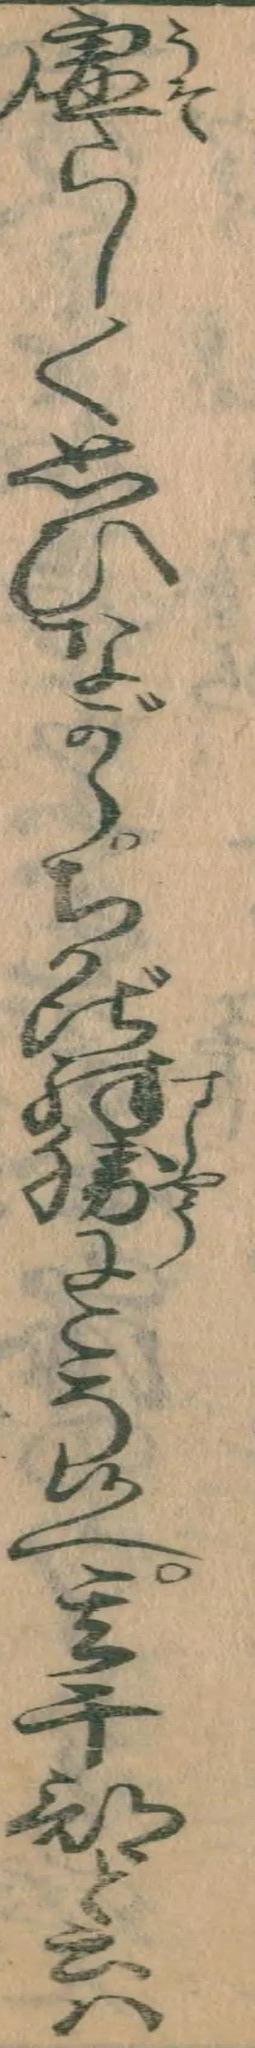虚らし〱思ひながら。ちか比殊勝にこそ候へ。其千部と云は
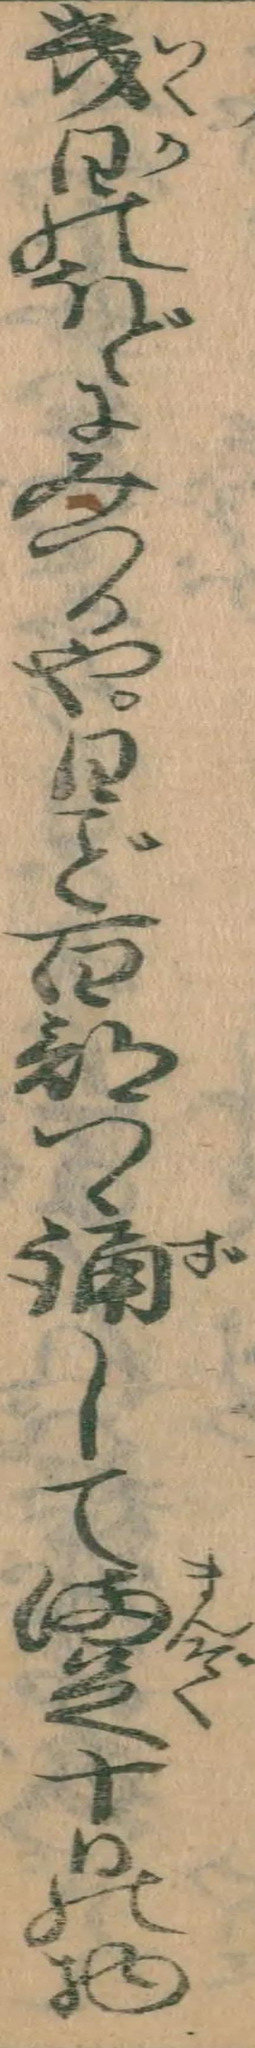幾日のほどにみつるや。日ごと百部つゝ誦して満足十日の物
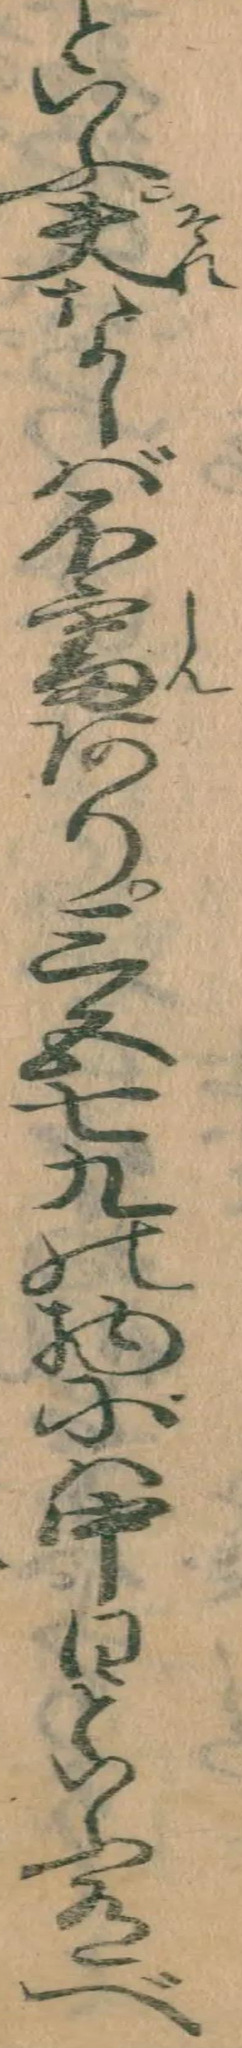といふ。夫ならば不審あり。三五七九の物には中日といふ有べ
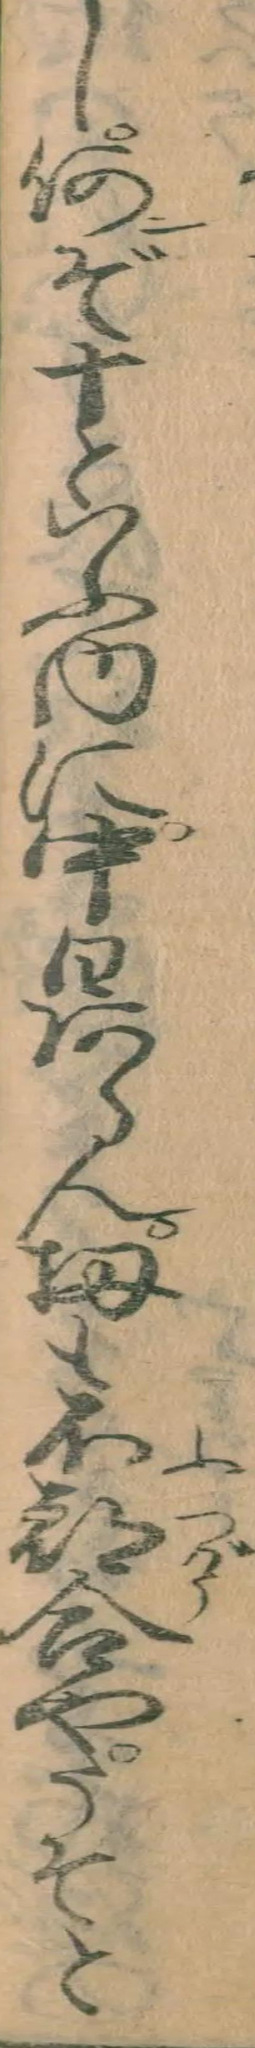し。何十といふ内に。中日あらん。扨も不部合や。うそと

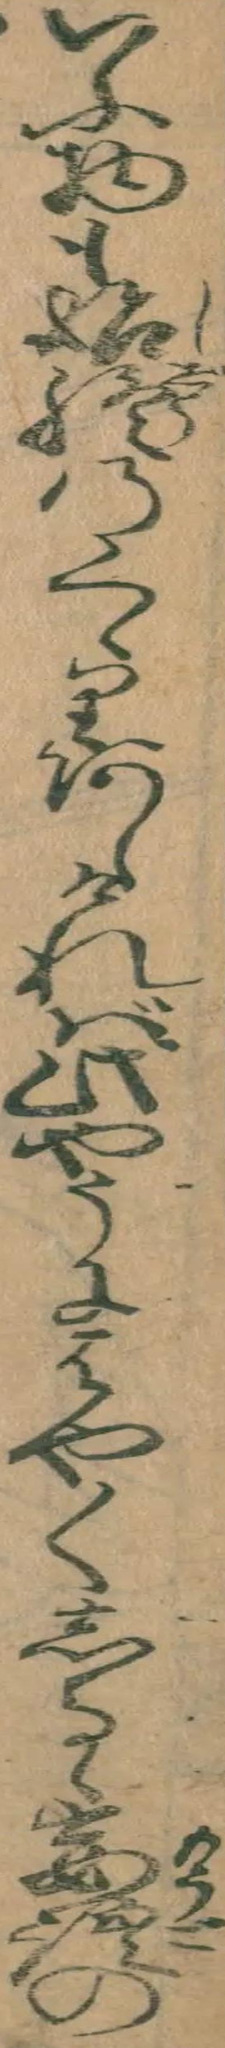いふ物も始終のくゝりあしければ此やうにはや〱しるゝ妄語の
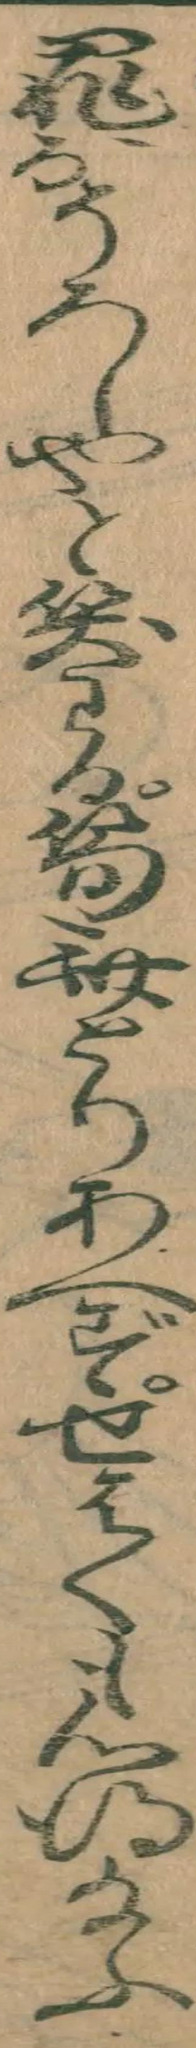罪おそろしやと笑わる。筍斎とりあへず。せはくも心得給ふ
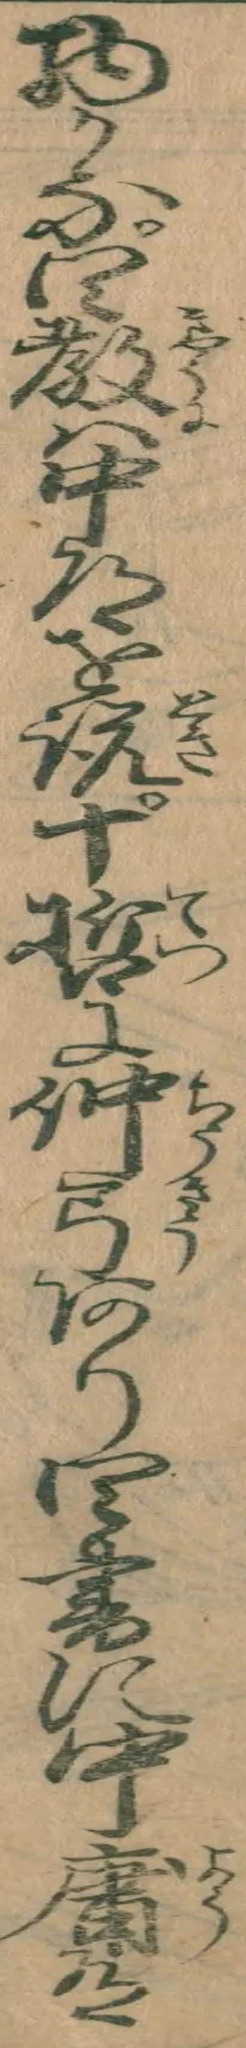物かな。四教は中道を説。十哲に仲弓あり四書に中庸有
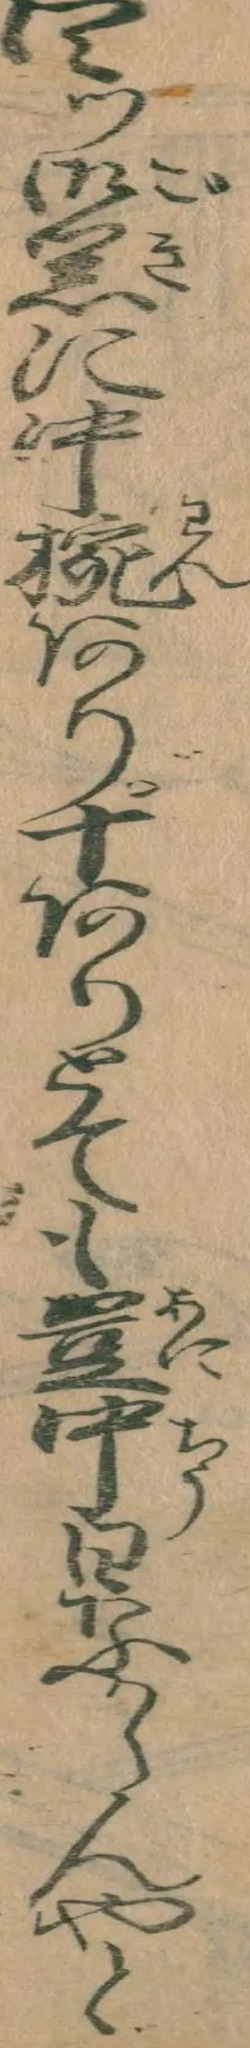四つ御器に中椀あり。十ありとても豈中日なからんやと
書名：新竹斎 5巻
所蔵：国立国会図書館 National Diet Library, JAPAN
